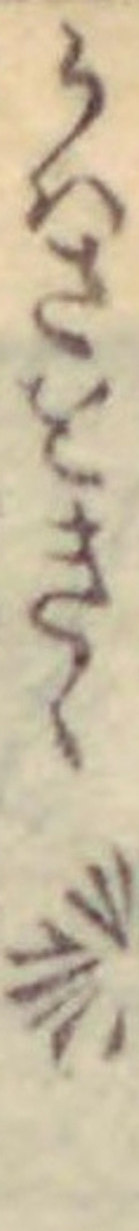うはさをきゝ
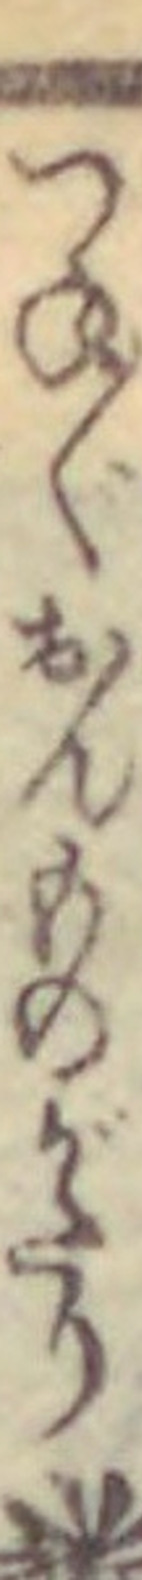つね〴〵おんものがたり
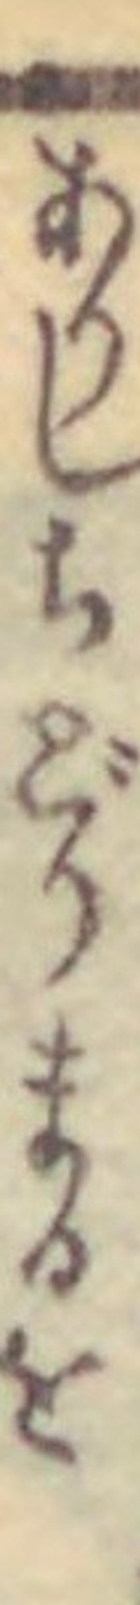ありしちどりまるを
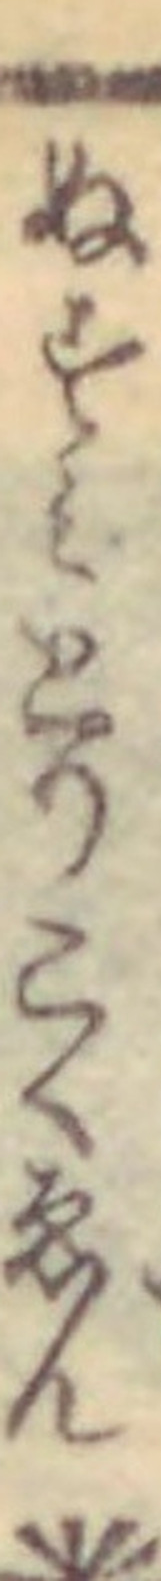ぬすみとりこくゑん
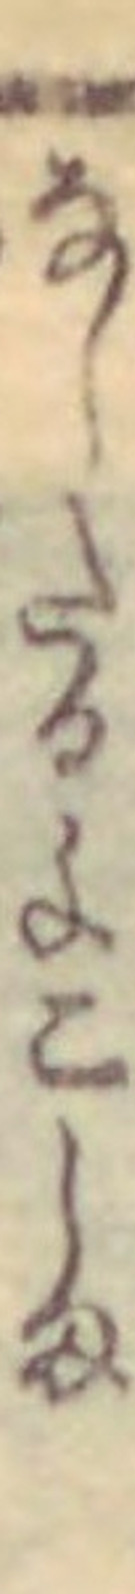なしたるよこしま
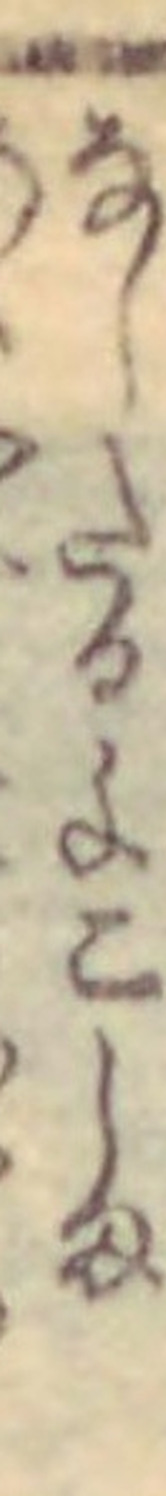なしたるよこしま
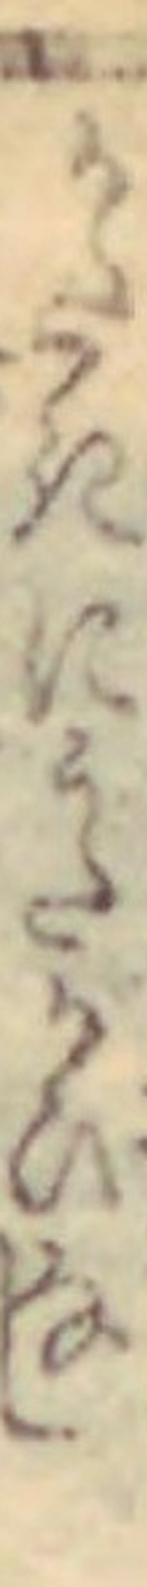かたきにうたがひなし
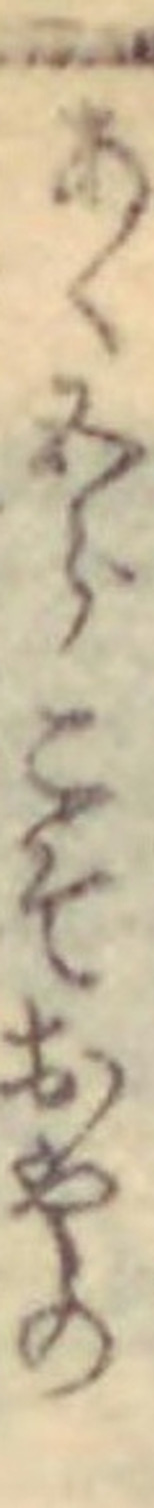あく五郎こそおやの
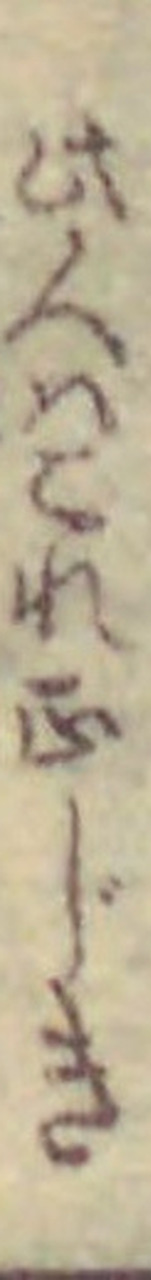此人はこれ正じき
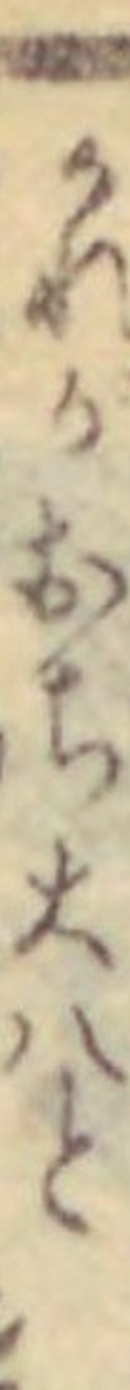かれがおぢ大八と
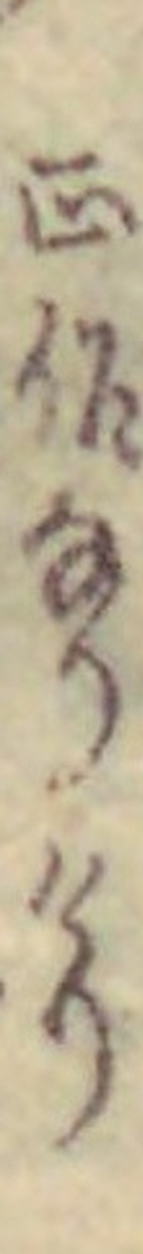正作なりけり
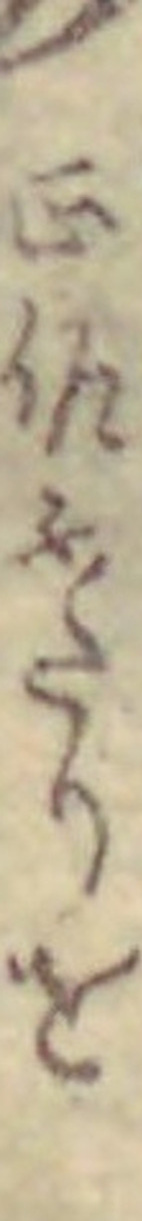正作ふたりを
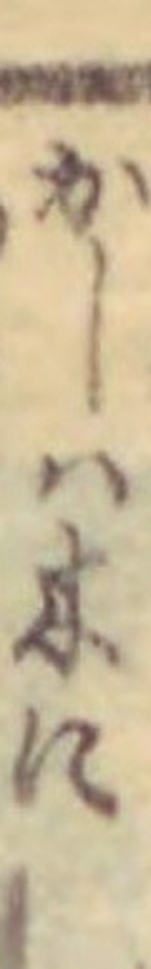かしは木に
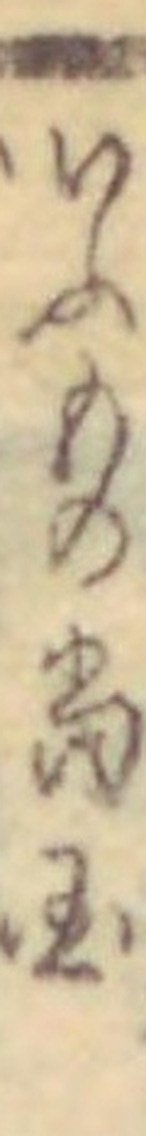いふもの當国
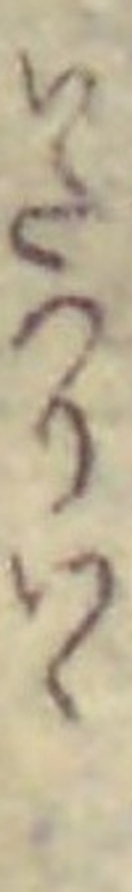いたはりつゝ
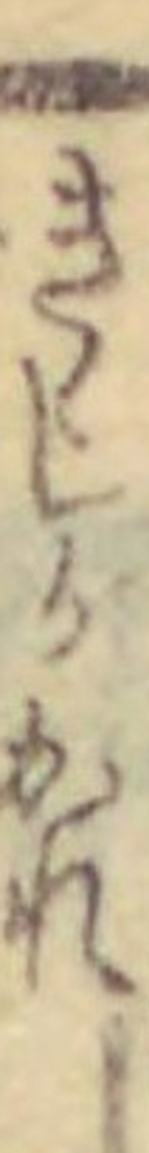きゝしがかれ
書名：八ツ目鱣因縁物語 3巻
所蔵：国立国会図書館 National Diet Library, JAPAN
